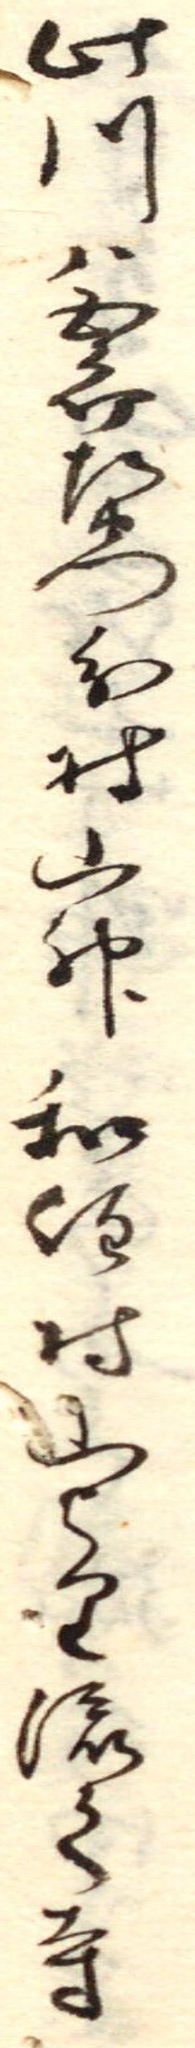此川は五郎左衛門分村山神和住村山より流て寺
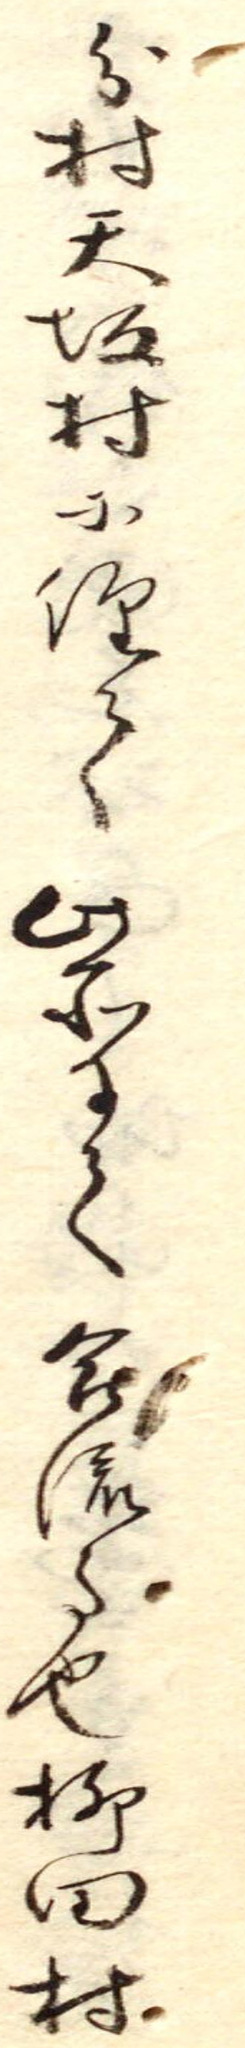分村天坂村に経て此所にて合流る也
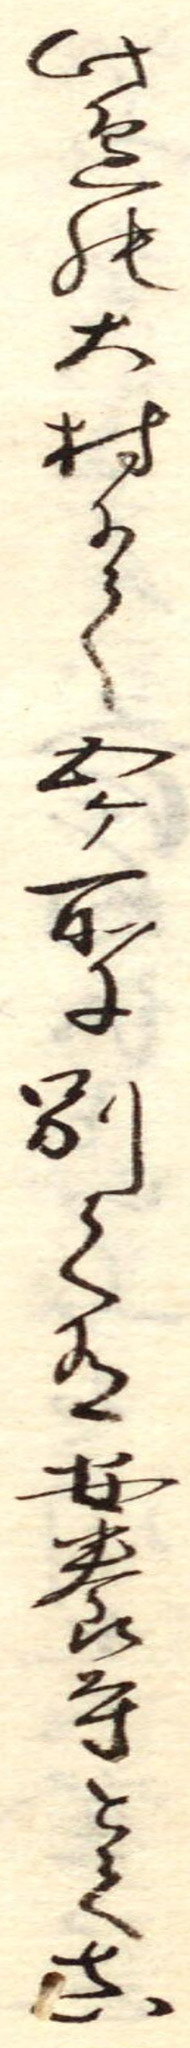此辺の大村にて五ヶ所に別て有安養寺とて真
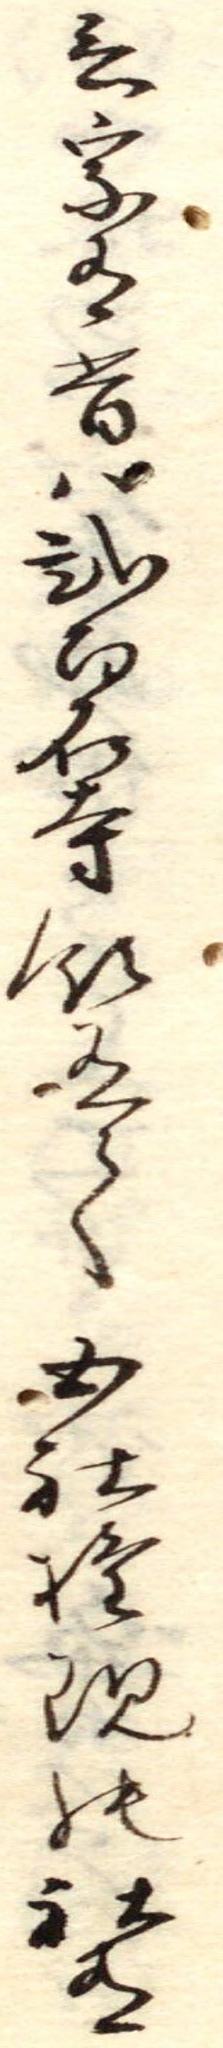言宗有昔は弐百石寺領有て五社権現の社有
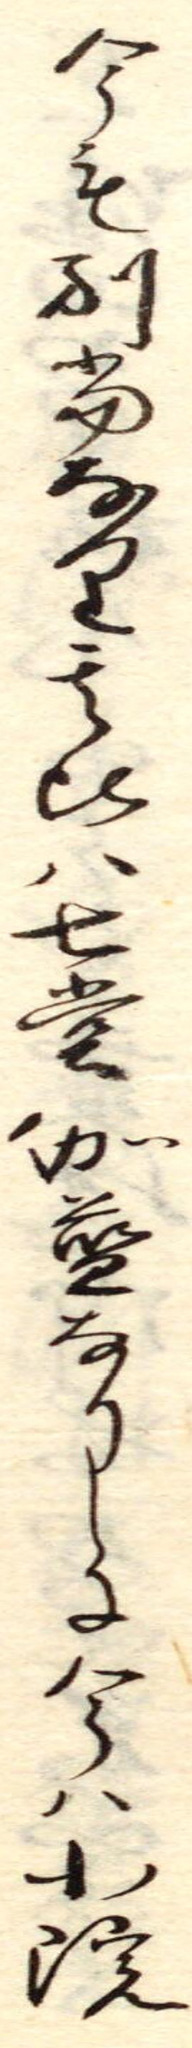今も別当なり其比は七堂伽藍なりしに今は小院
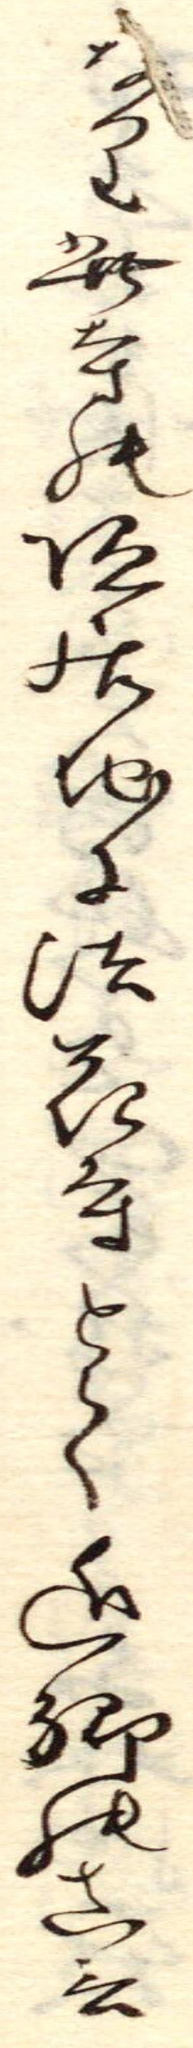なり此寺の隠居地に法花寺とて近郷の真言
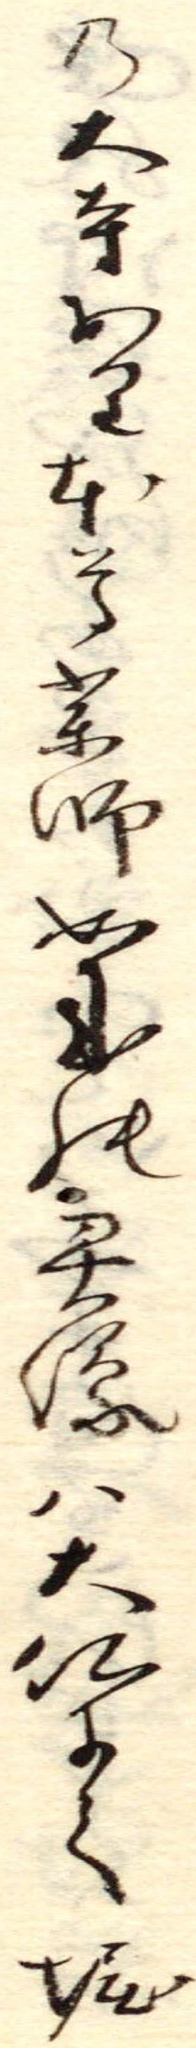の大寺あり本尊薬師如来の霊像は大仏にて堀
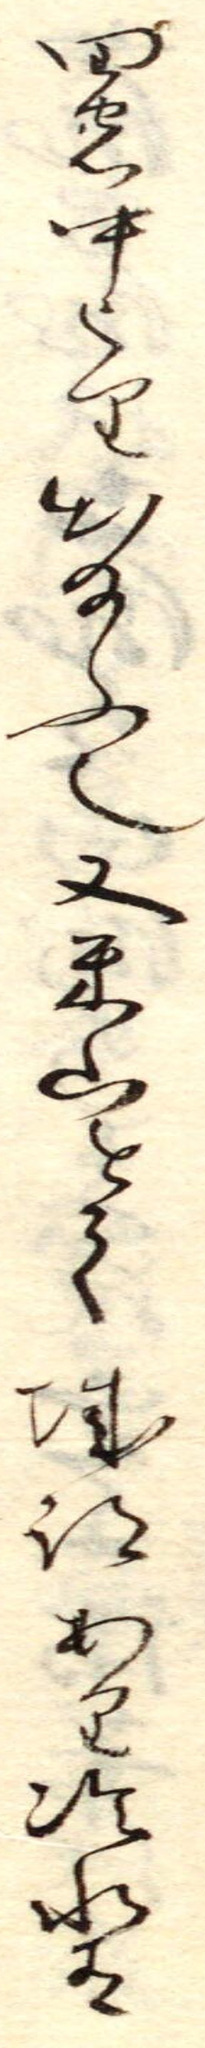田の中より出給ふ也又米山とて城跡あり冷水有
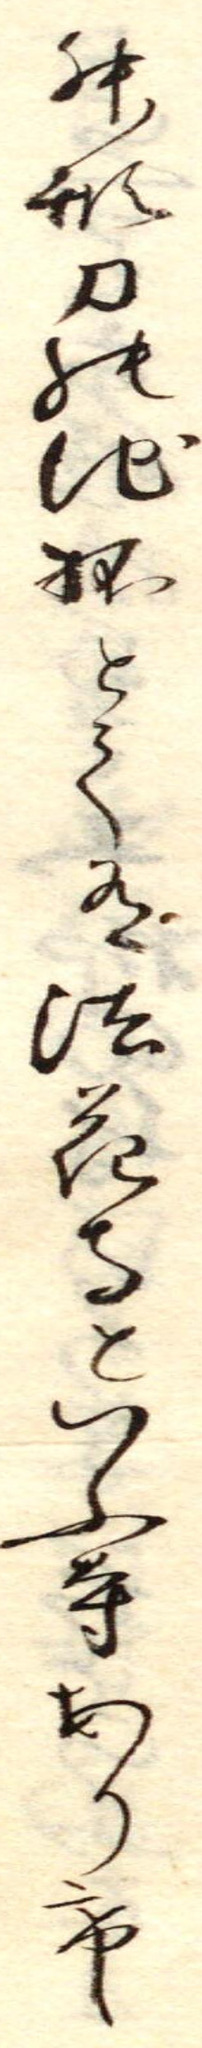舛形刀の池抔とて有法花寺といふ寺ありけ
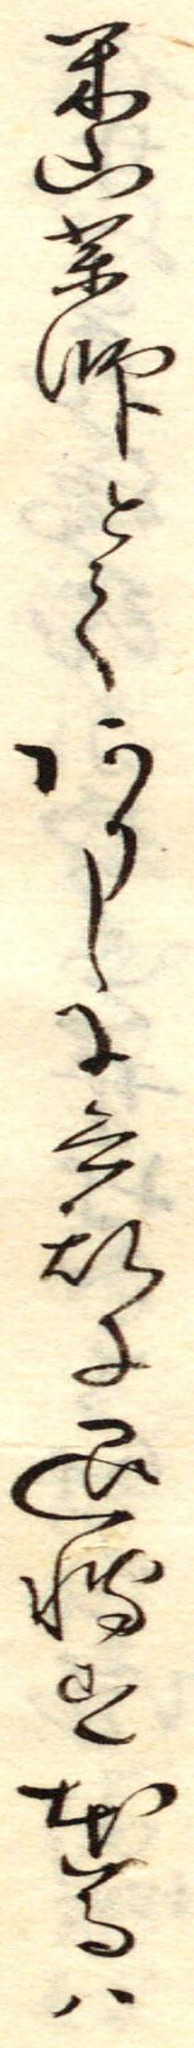米山薬師とてありしに兵乱に退転す本尊は

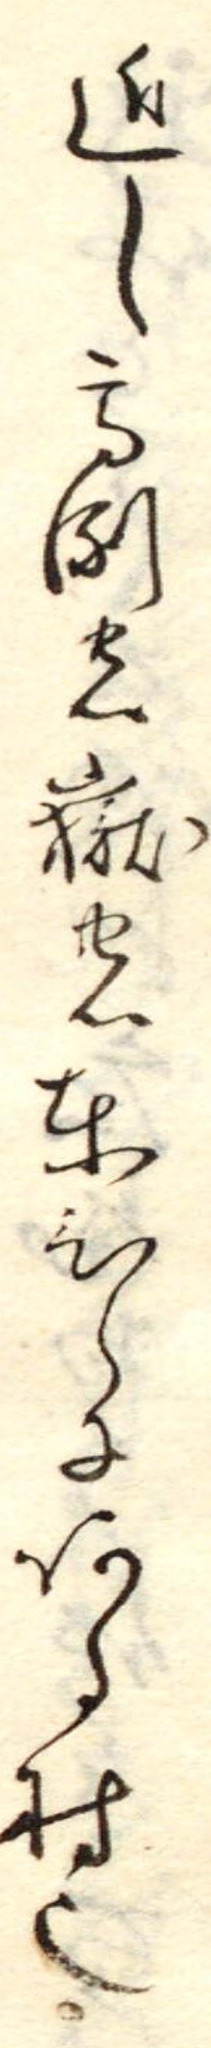近し高洲の嶽の東ひらにある村也
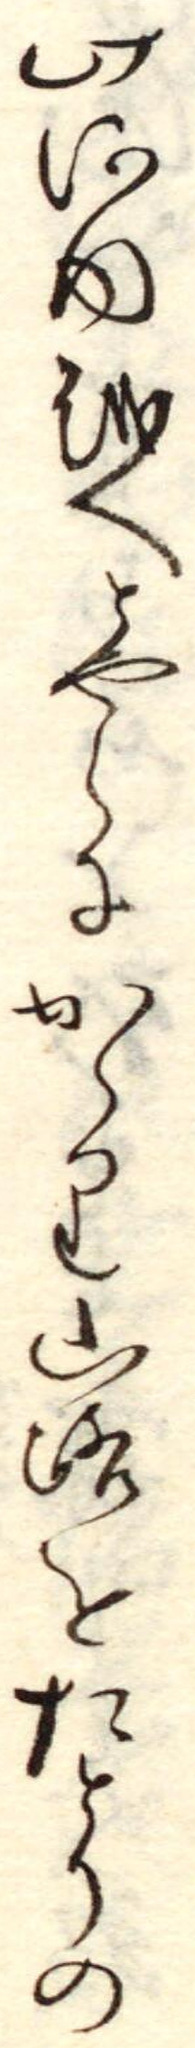此河内越へとやらにかゝり山路をたとりの
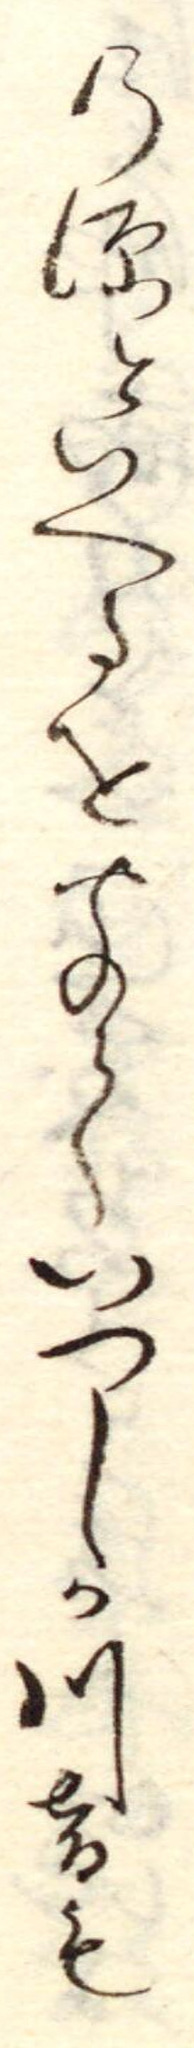の源といへるをやかていつしか川音も
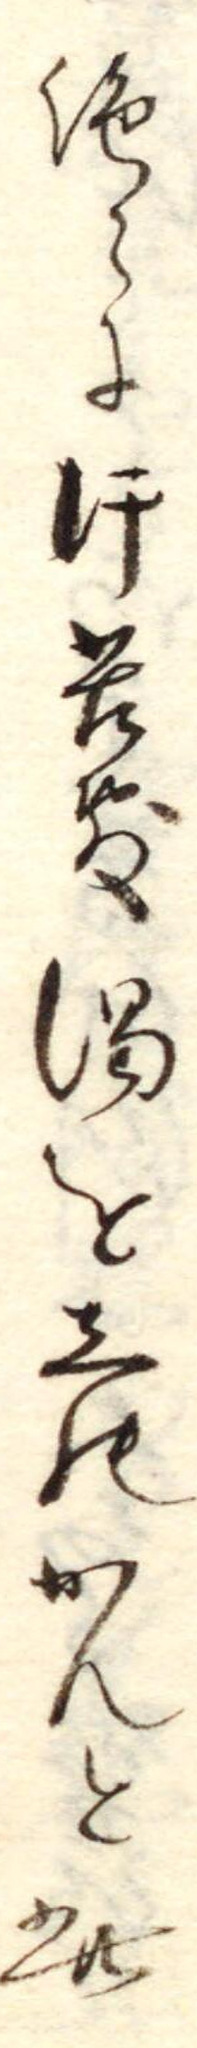絶々に汗苦敷渇をしのかんと此
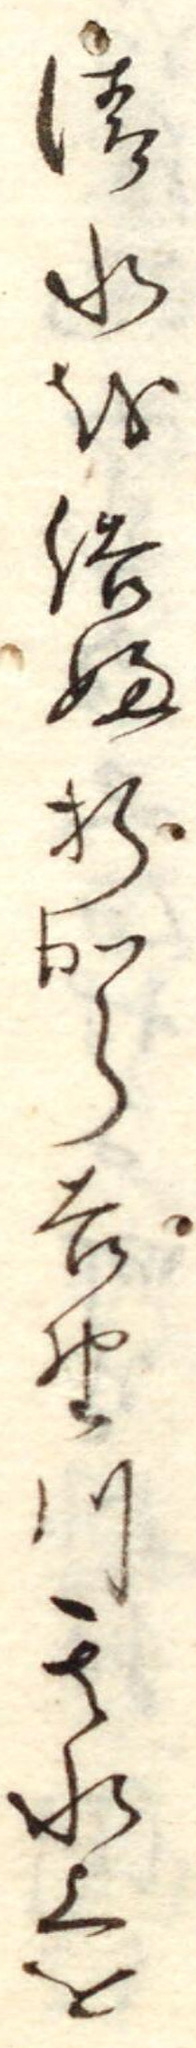清水を詰ふ折から吉野川其水上を
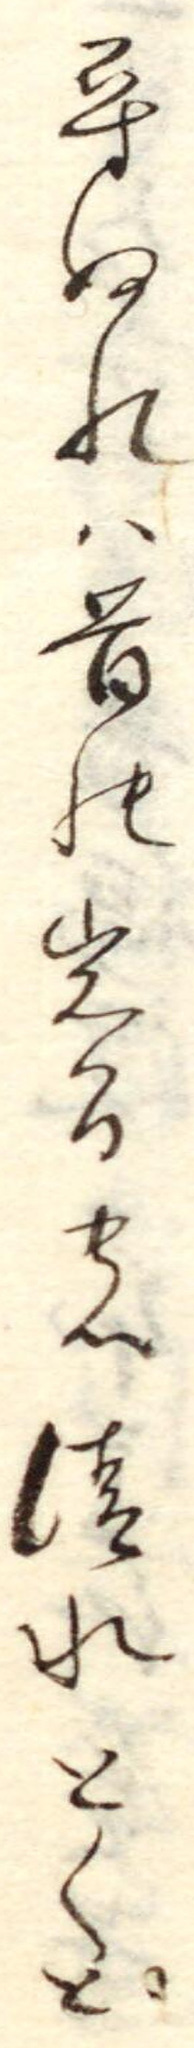尋ねれは昔の岩間の清水とくと
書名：能登名跡誌
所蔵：Ishikawa Prefectural Library
